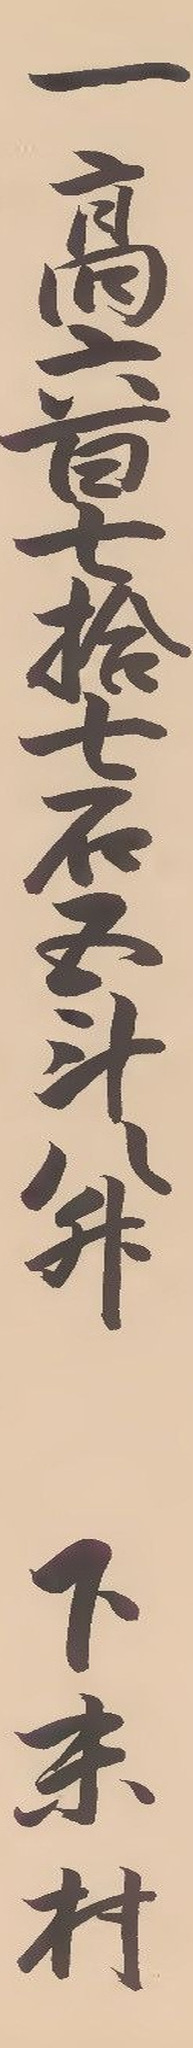一高六百七拾七石五斗八升下末村
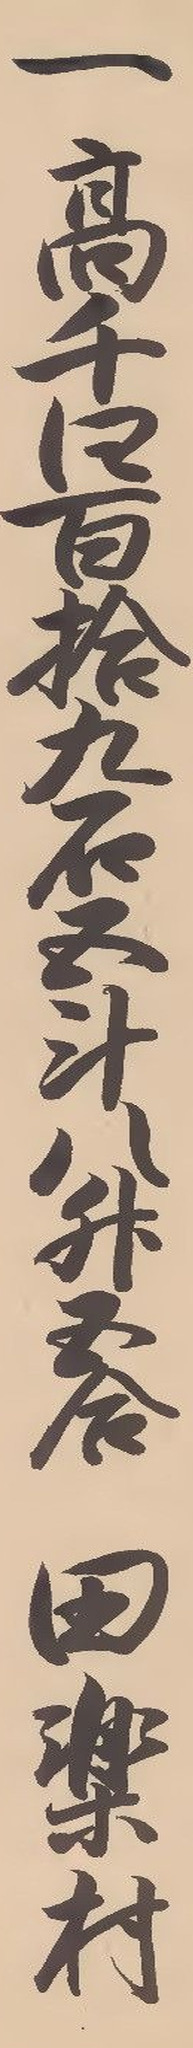一高千四百拾九石五斗八升五合田楽村
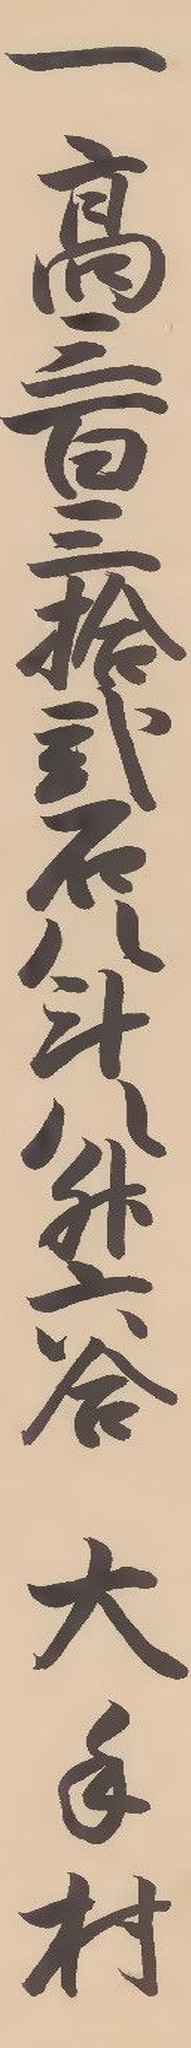一高三百三拾弐石八斗八升六合大手村
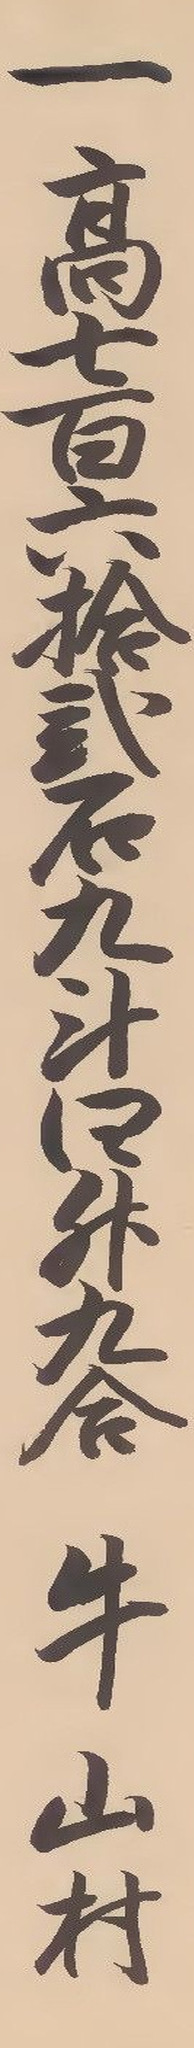一高七百六拾弐石九斗四升九合牛山村
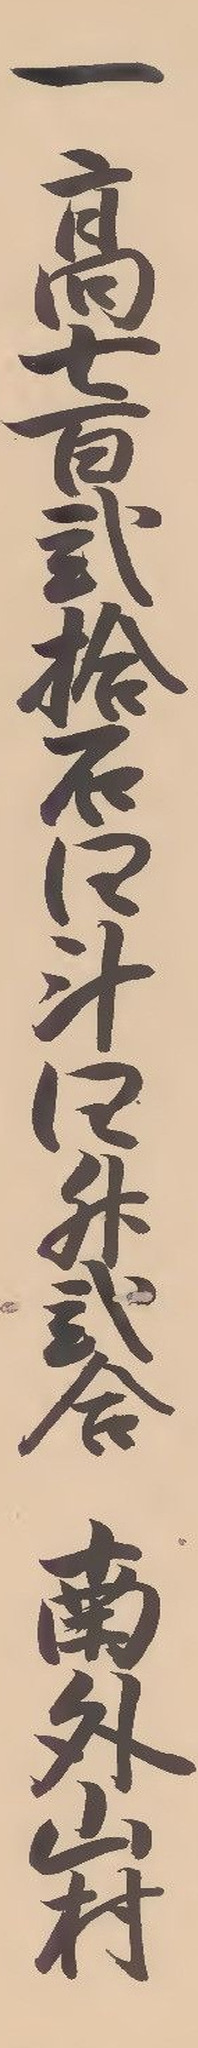一高七百弐拾石四斗四升弐合南外山村

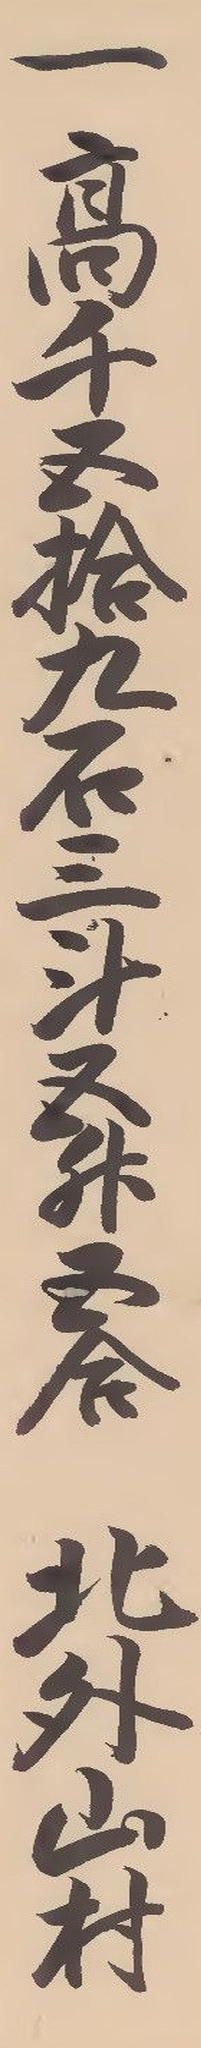一高千五拾九石三斗五升五合北外山村
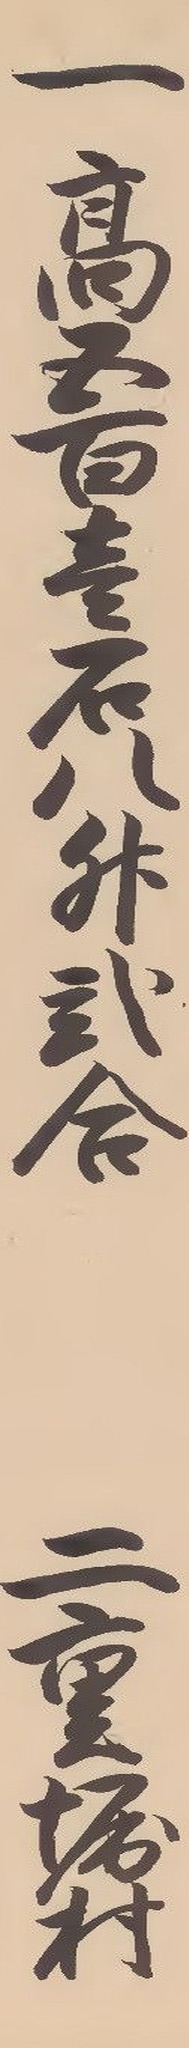一高五百壱石八升弐合二重堀村
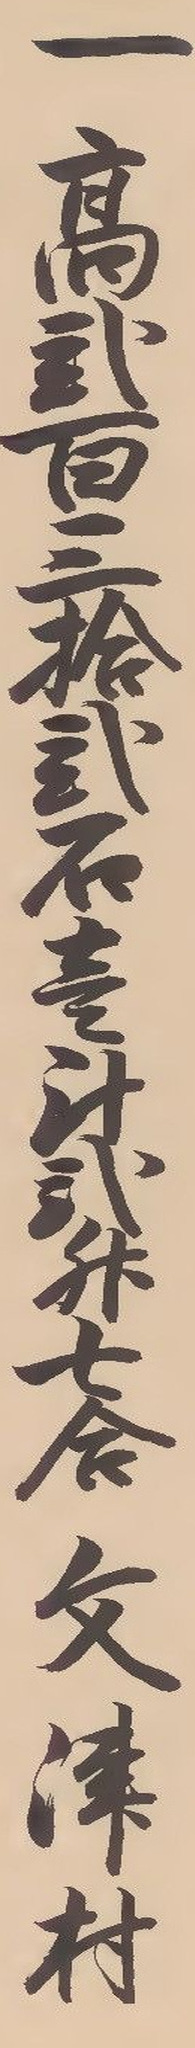一高弐百三拾弐石壱斗弐升七合文津村
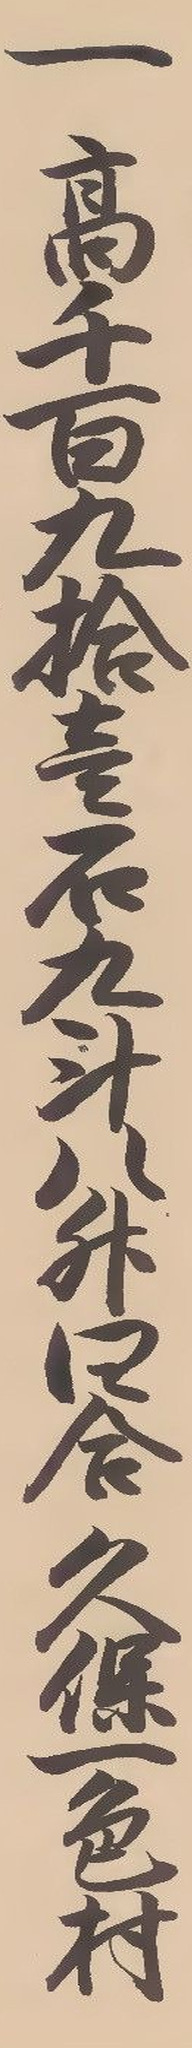一高千百九拾壱石九斗八升四合久保一色村
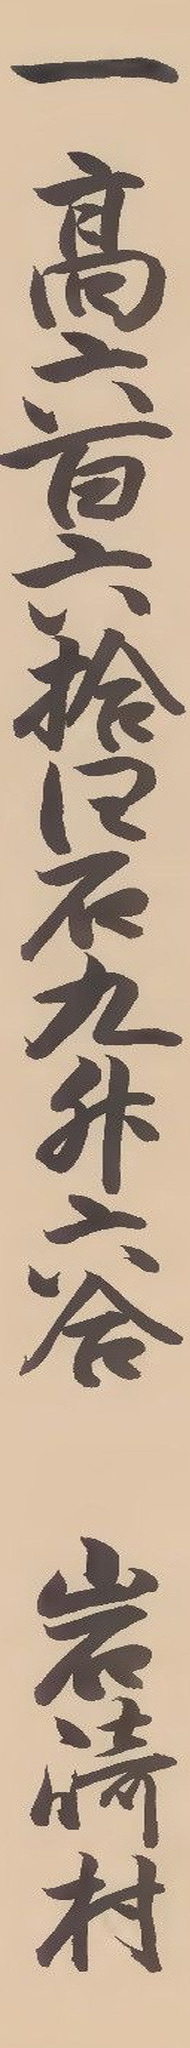一高六百六拾四石九升六合岩崎村
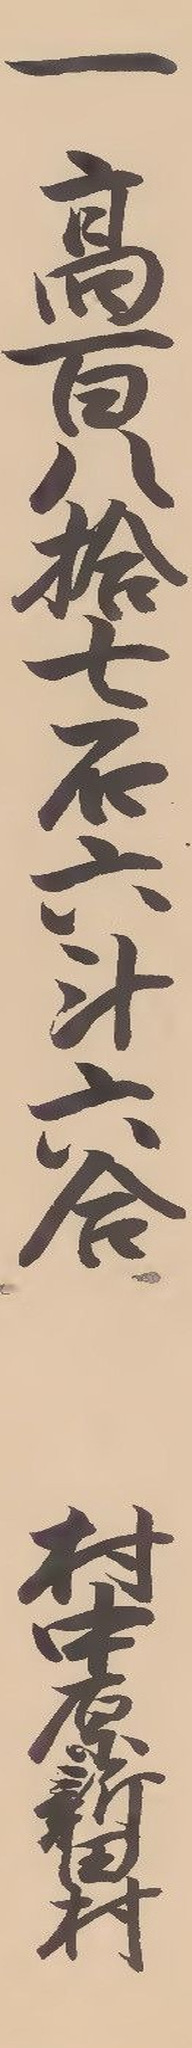一高百八拾七石六斗六合村中原新田村

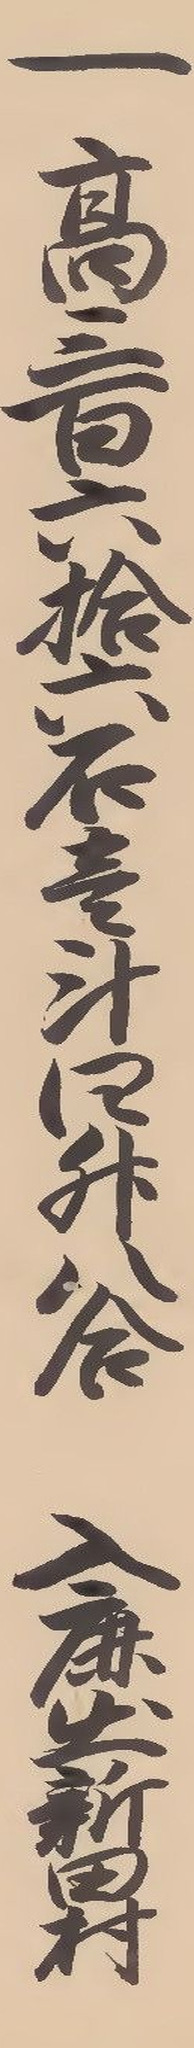一高三百六拾六石壱斗四升八合入鹿出新田村
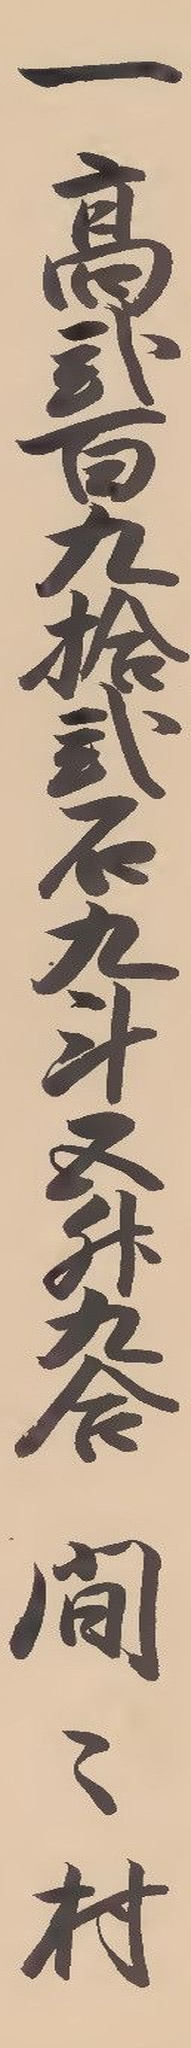一高弐百九拾弐石九斗五升九合間々村
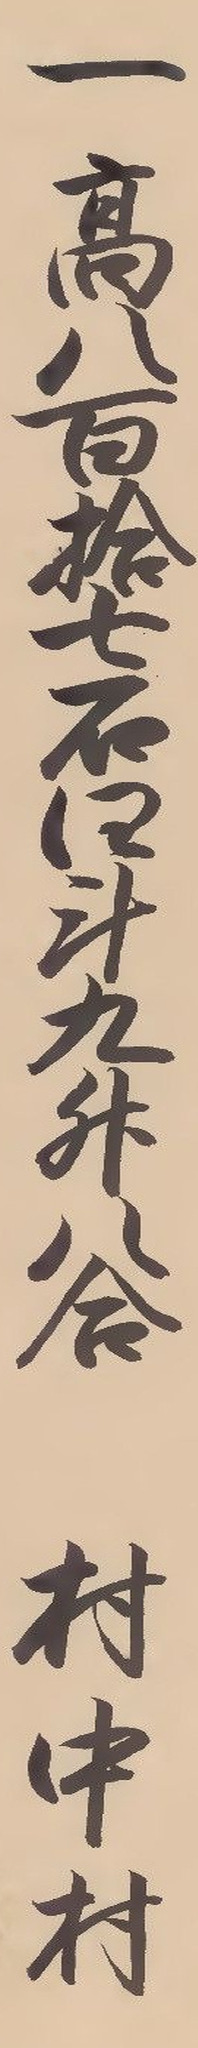一高八百拾七石四斗九升八合村中村
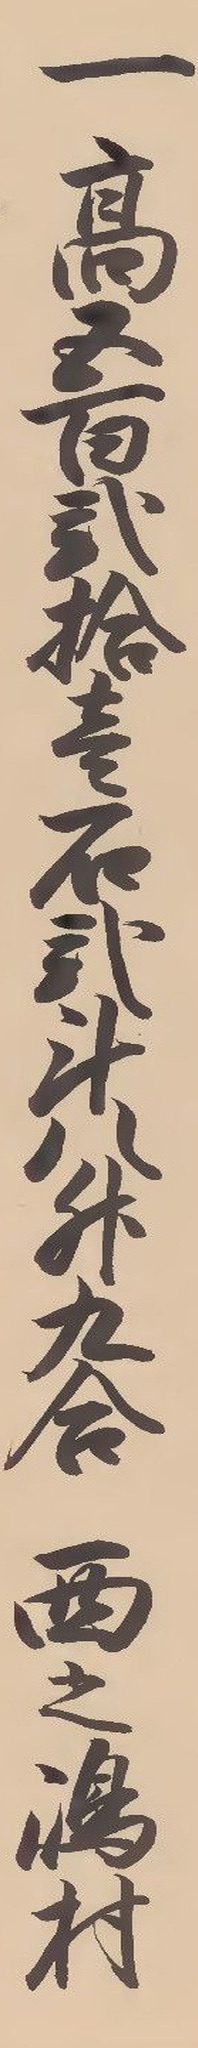一高五百弐拾壱石弐斗八升九合西之島村
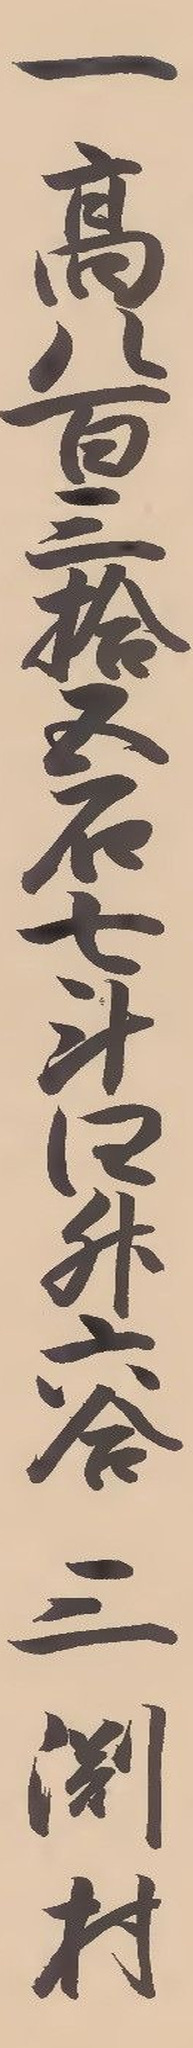一高八百三拾五石七斗四升六合三渕村
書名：尾張国郷帳
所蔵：国立公文書館 National Archives of Japan
